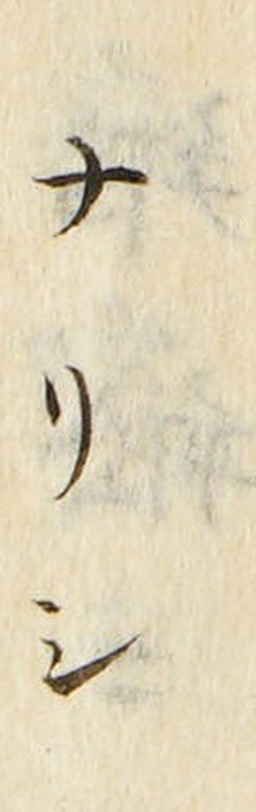ナリシ
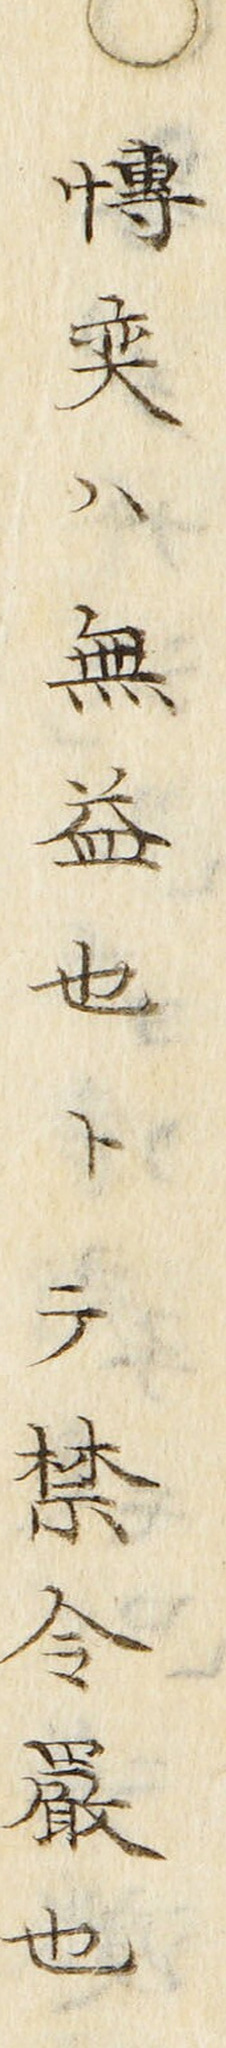○博奕ハ無益也トテ禁令厳也
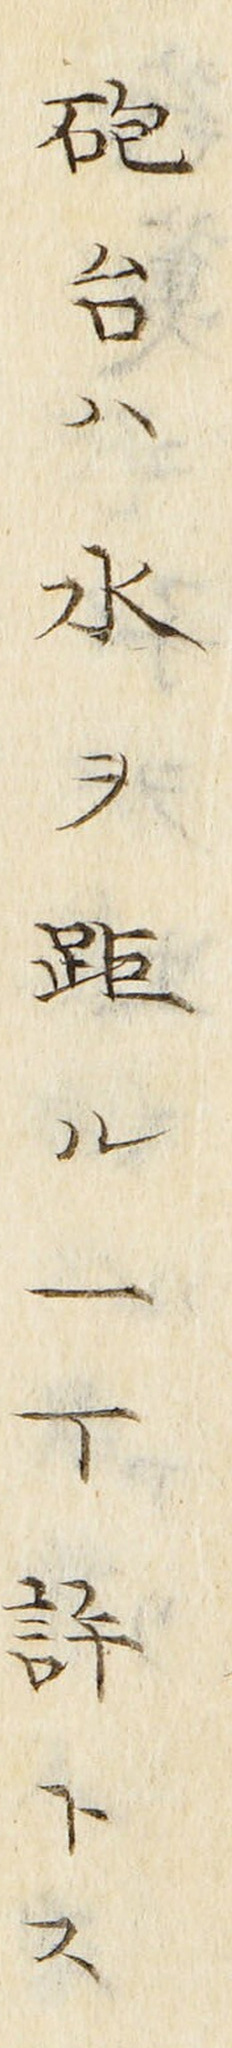〇砲台ハ水ヲ距ル一丁許トスル
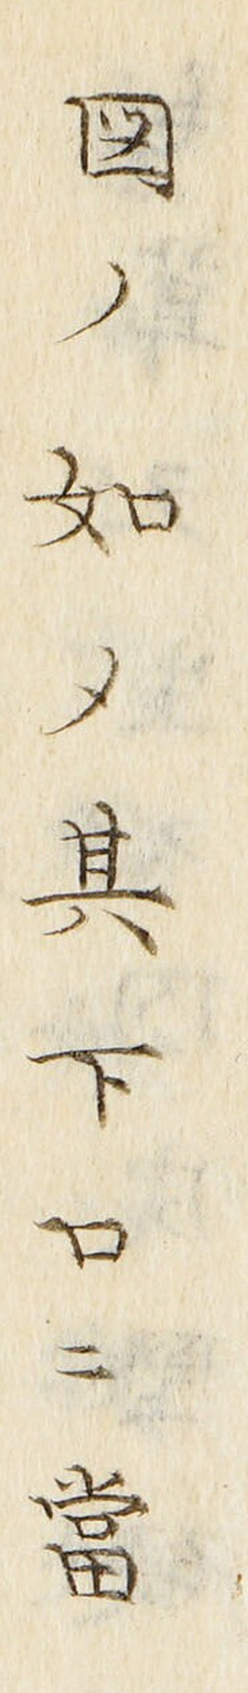図ノ如シテ其下口ニ當
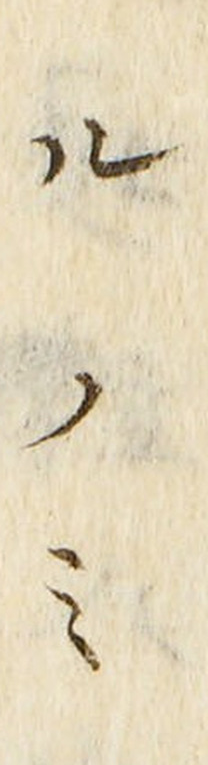ルノミ
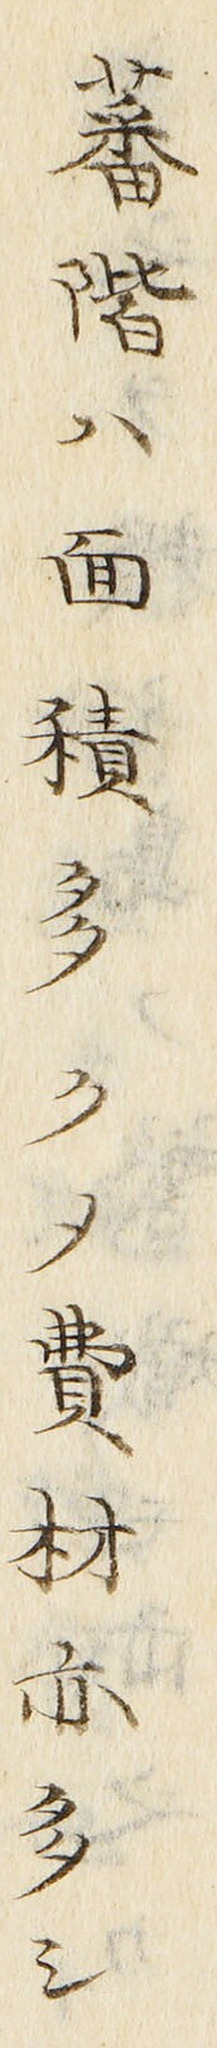〇蕃階ハ面積多クシテ費材亦多シ
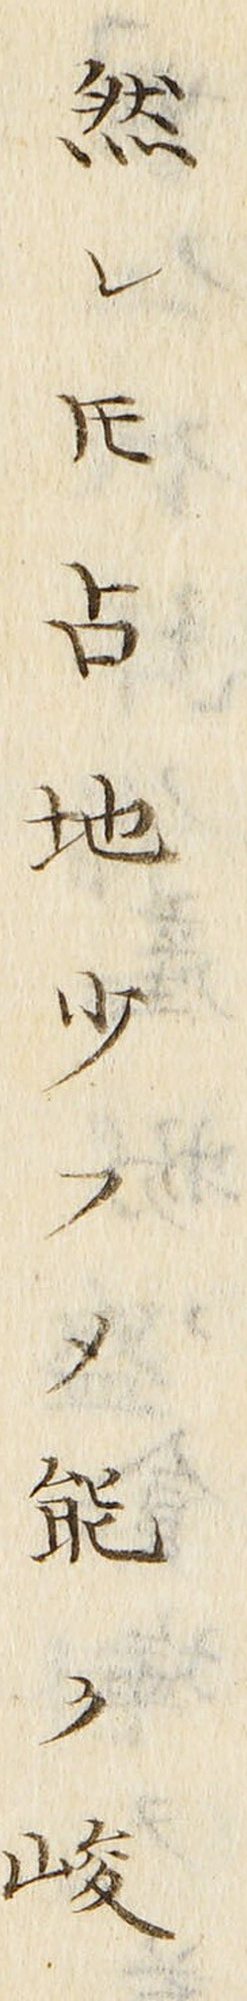然レトモ占地少フシテ能ク峻
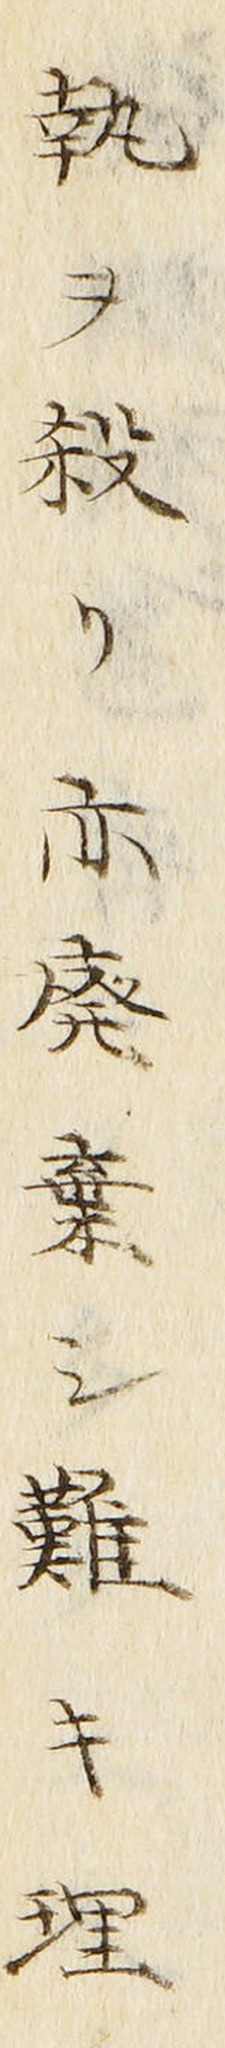執ヲ殺リ亦廃棄シ難キ理
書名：蕃談
